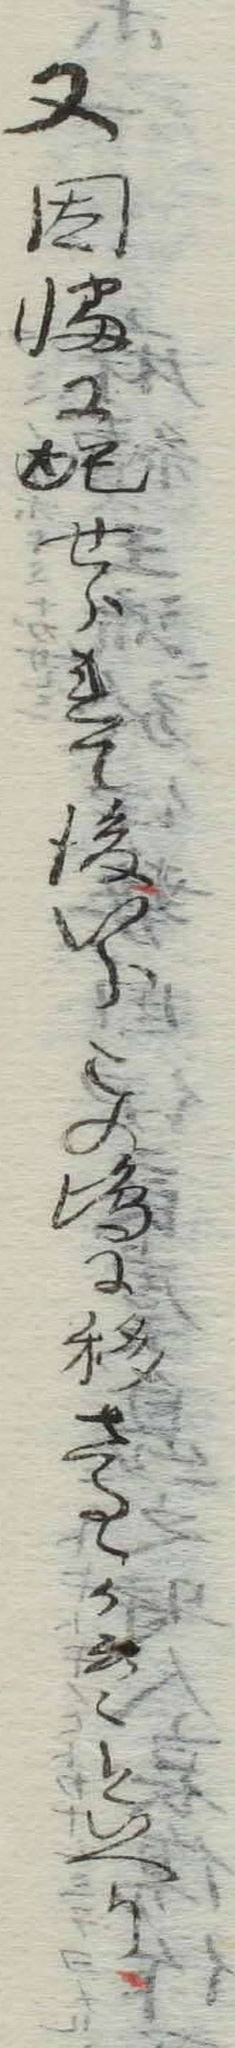又因幡に配せられて後、いらこの嶋に移さるゝか云々といへり、
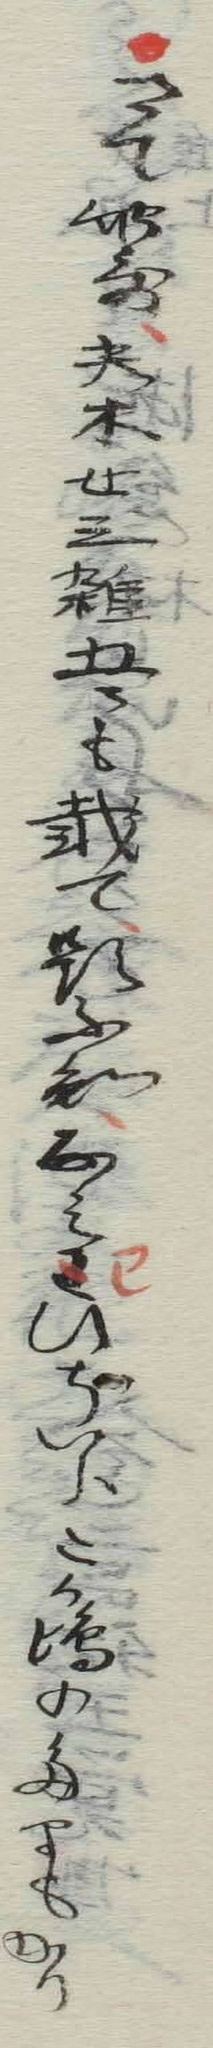●さて此歌、夫木廿三雑五ニも載て題不知、なみわひぢいらこか嶋のたまもかり
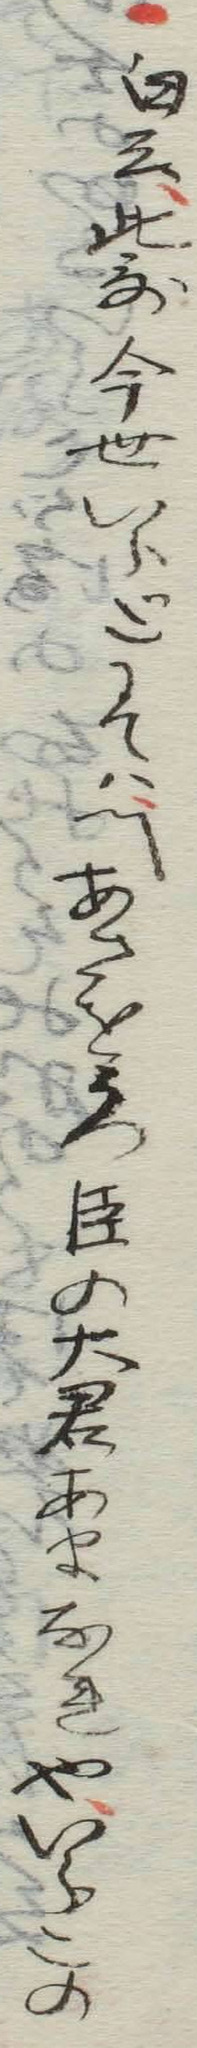●白云、此歌今世いらごにては、〽あさをうつ臣の大君あまなれや、いらこの
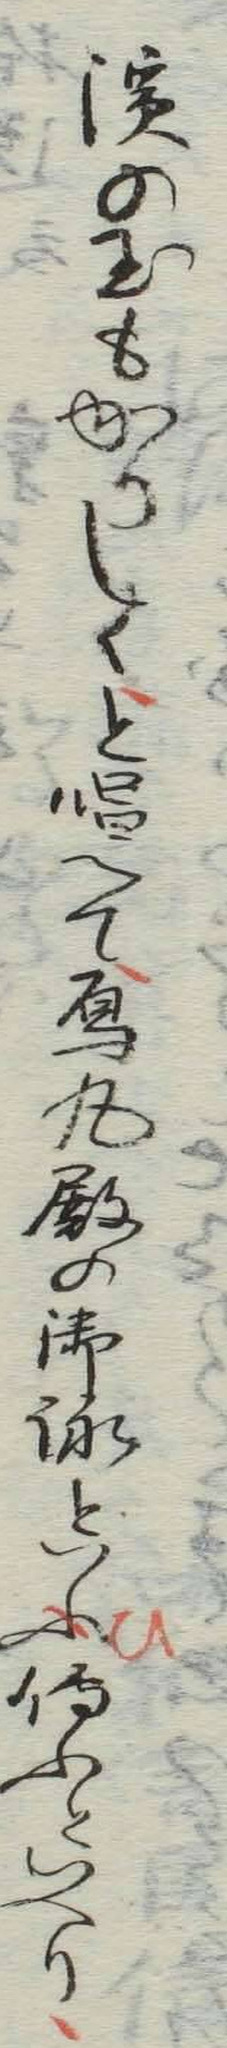濱の玉もかりしく、と唱へて、烏丸殿の御詠といひ伝ふといへり、
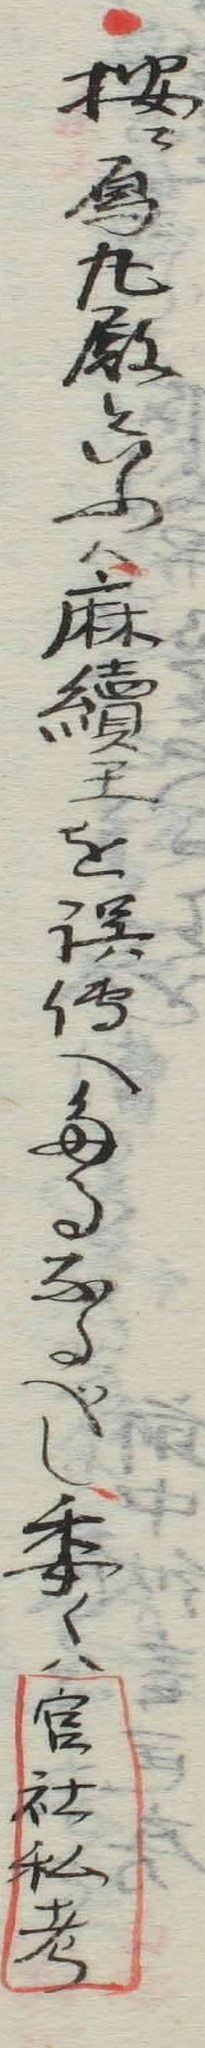●按ニ烏丸殿といふは、麻讀王を誤伝へたるなるべし、委くは官社私考

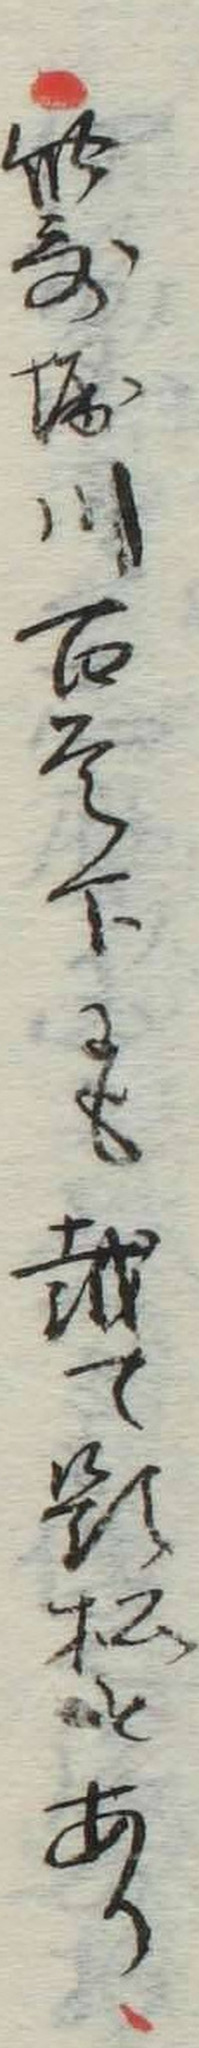●此歌堀川百首下にも載て題松とあり、
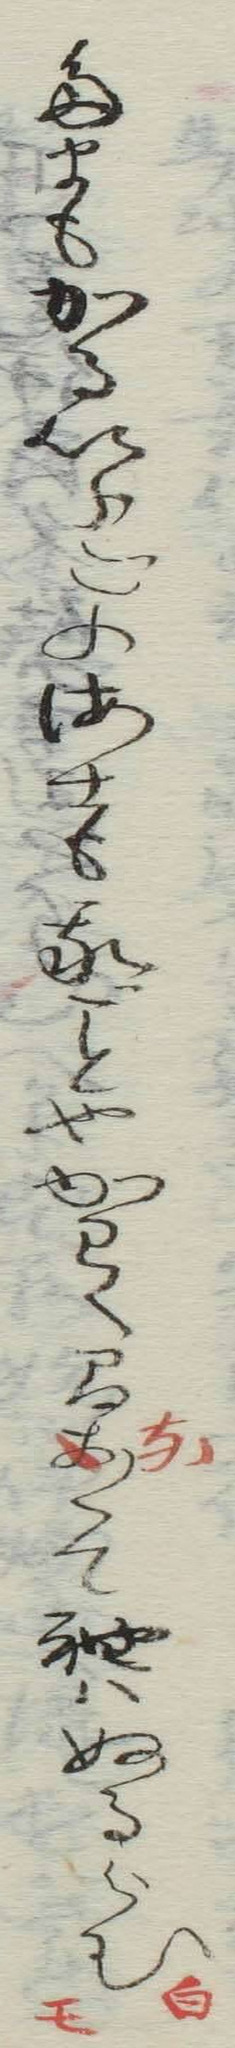たまもかるいらごの海士も我ごとやかわく間なくて袖はぬるらむ白モ
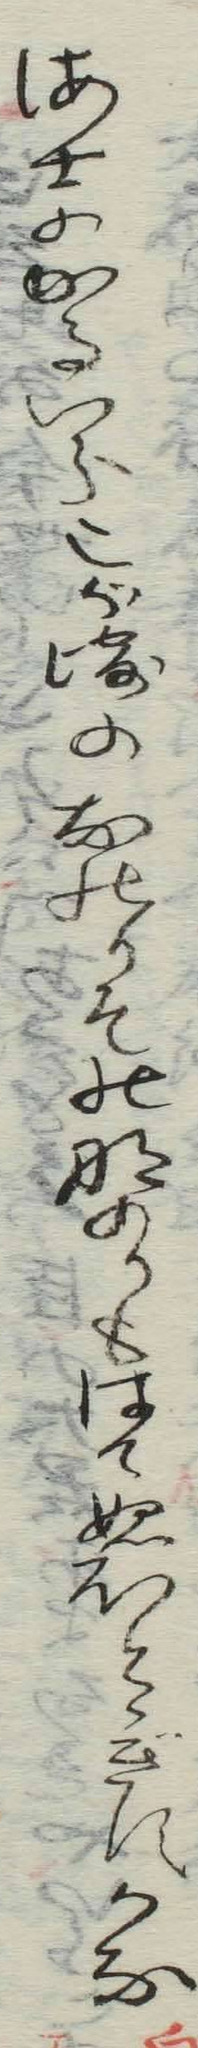海士のかるいらこが崎のなのりそのなのりもはてぬほとゝぎすかな白松モ
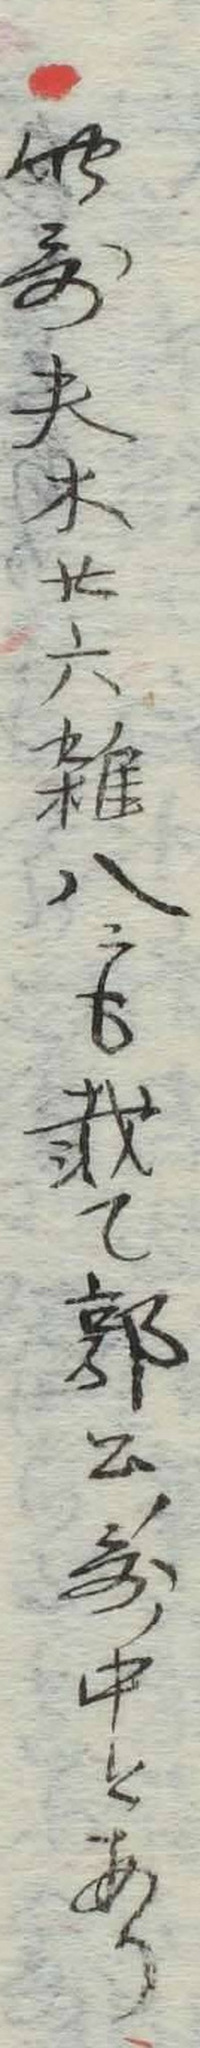●此歌夫木廿六雑八ニも載て郭公歌中とあり、
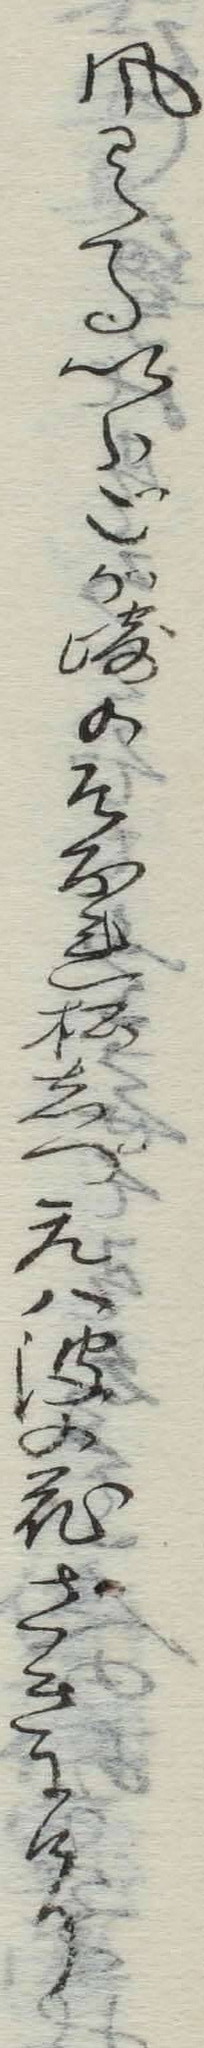風わたるいらごが崎のそなれ松しつえは波の花さきにけり白モ
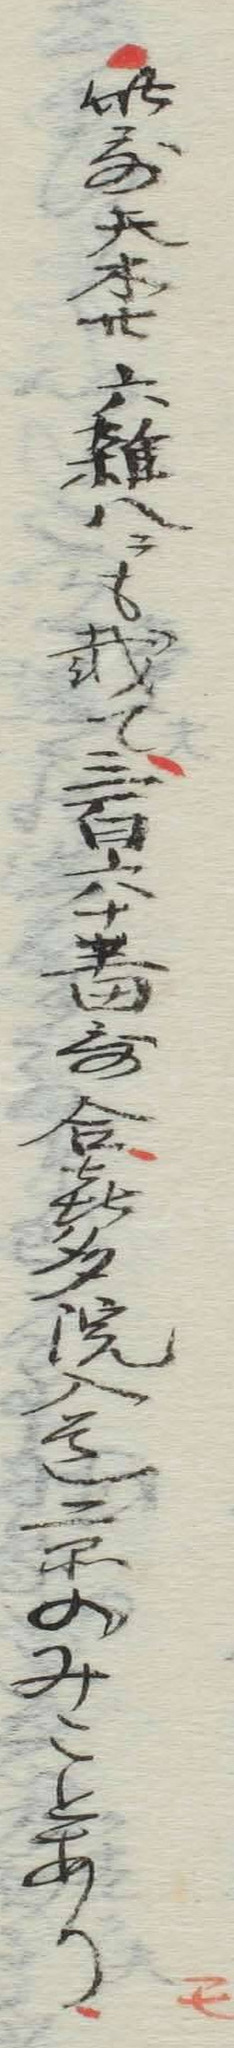●此歌夫木廿六雑八ニも載て、三百六十番歌合、㐂多院入道二品のみことあり、
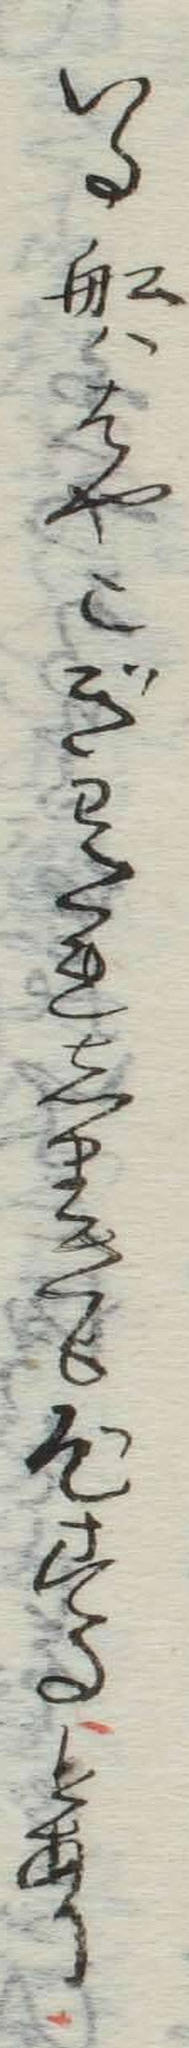いる船ははやこぎわたれしまきもぞする、とあり、
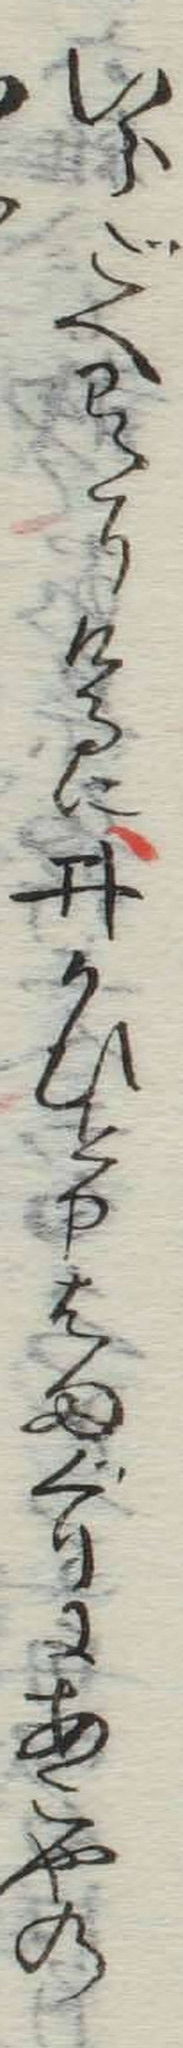いらごへわたりけるに、井かひと申はまぐりにあこやの
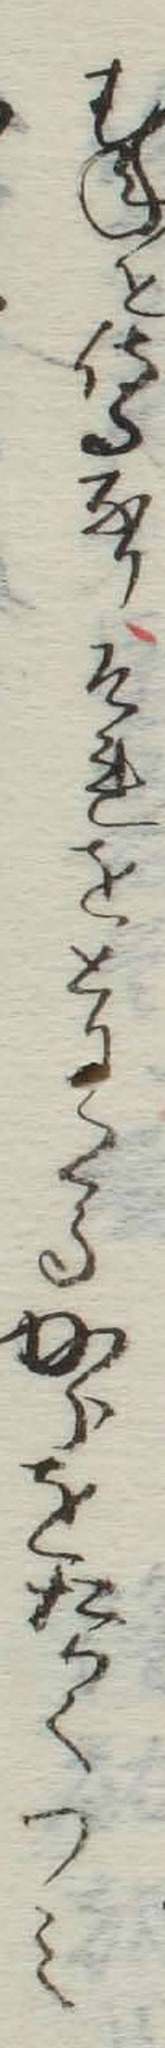むねと侍るなり、それをとりたるからをたかくつみ
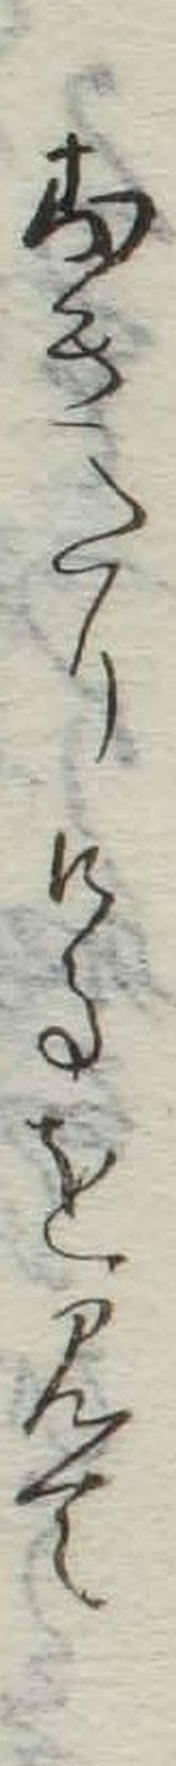おきたりけるを見て
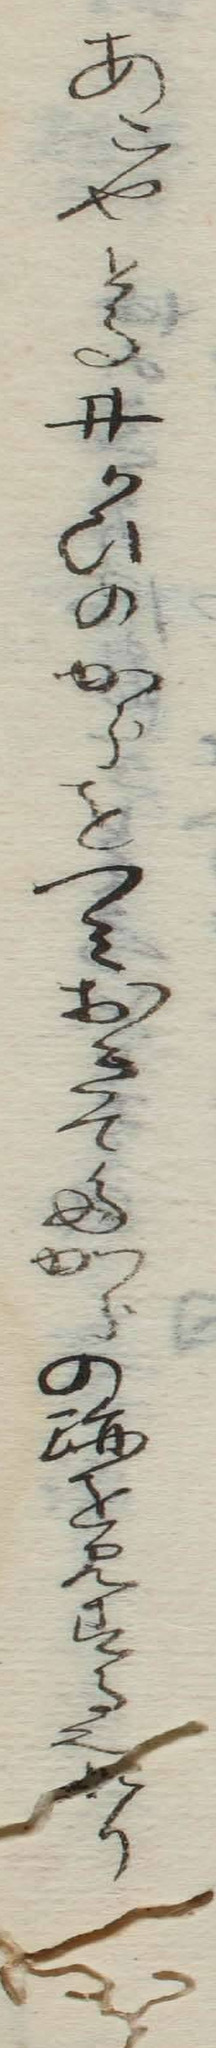あこやとる井かひのからをつみおきてたからの跡を見する也けり
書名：三河国古跡考
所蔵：国文学研究資料館
